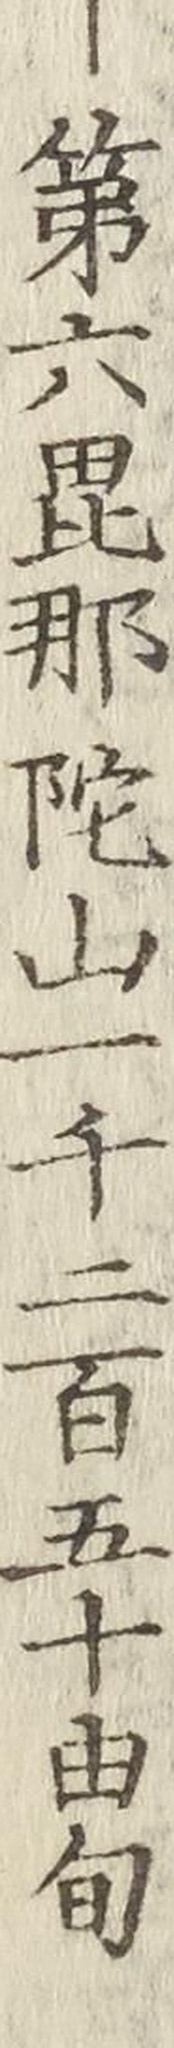第六毘那陀山一千二百五十由旬
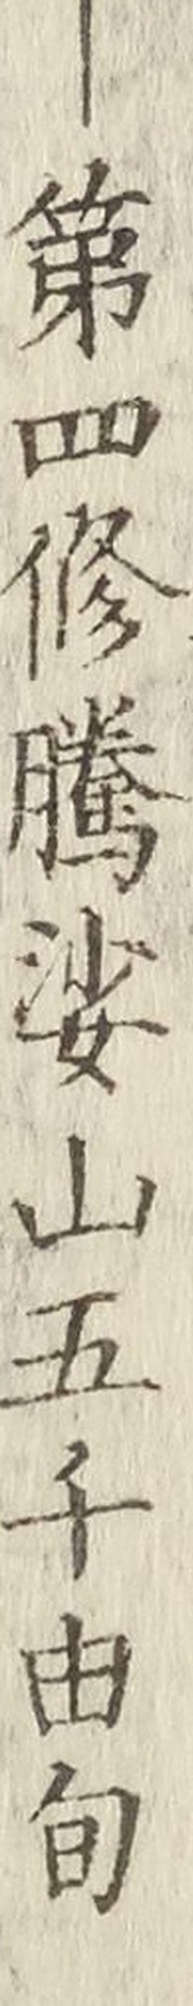第四修騰娑山五千由旬
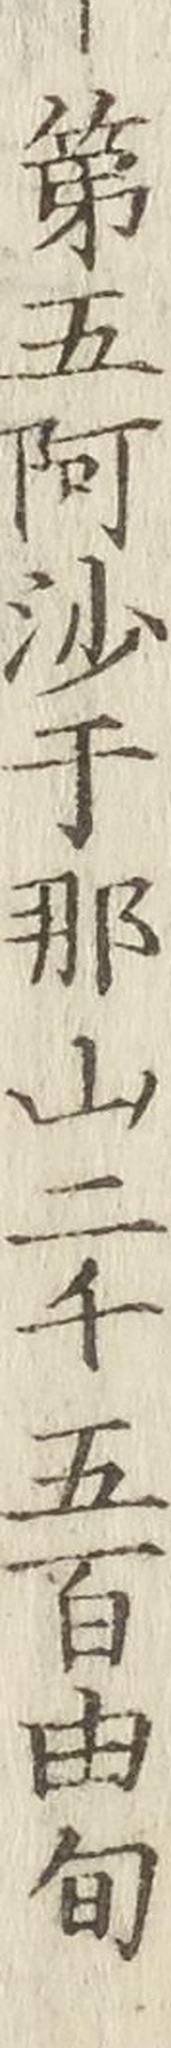第五阿沙干那山二千五百由旬
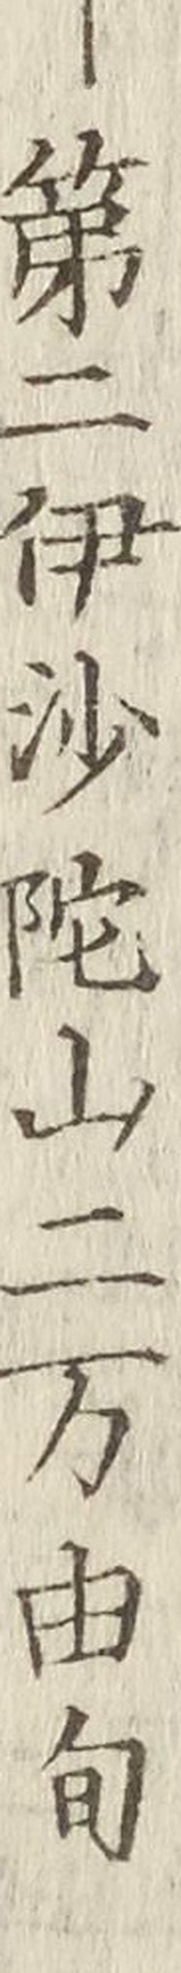第ニ伊沙陀山二万由旬
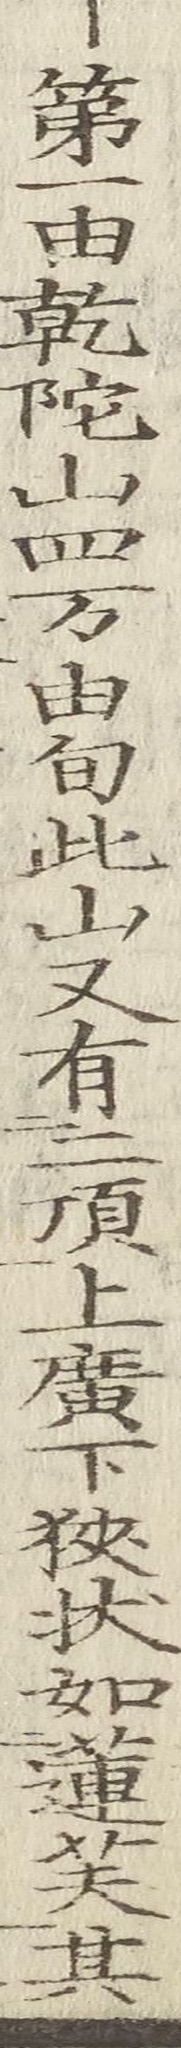第一由乾陀山四万由旬此山有ニニ頂上広下狭状可如ニ蓮芙其
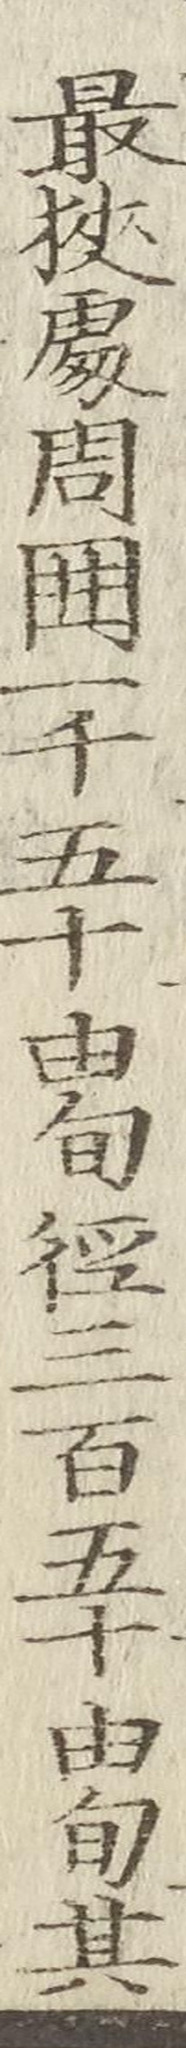最狭処周囲一千五十由旬径三百五十由旬其
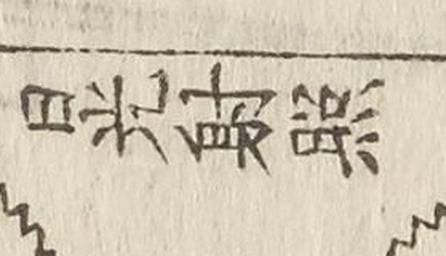日光射照
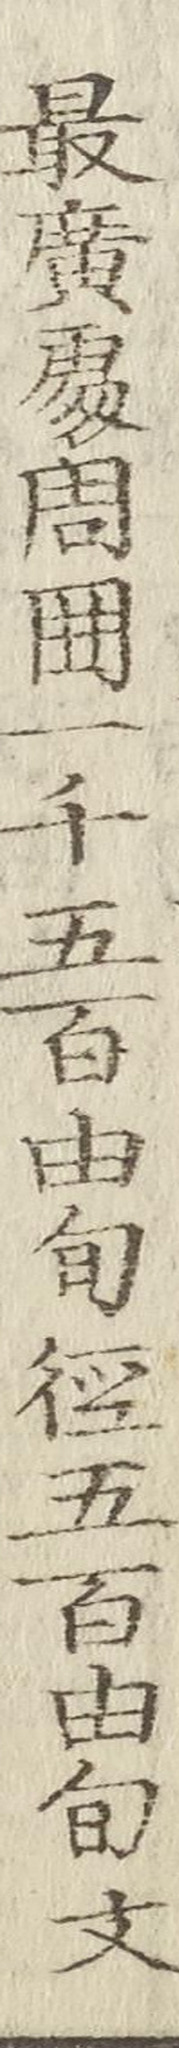最広処周囲一千五十由旬径五百由旬丈
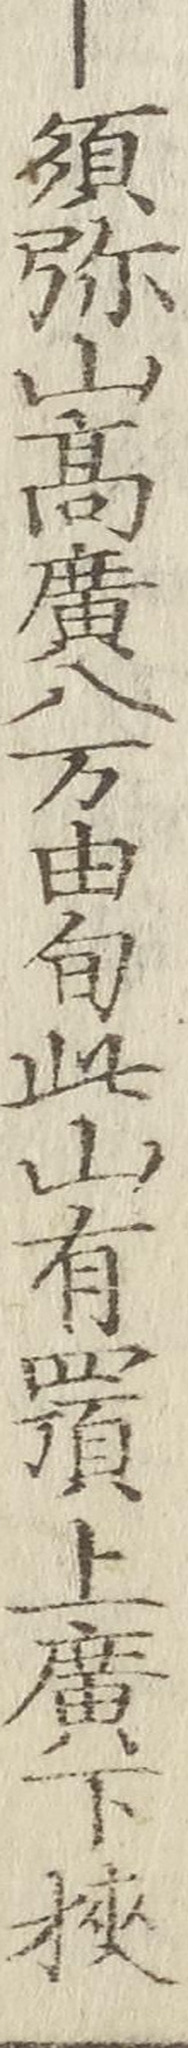須弥山高広八万由旬此山有四頂上広下狭
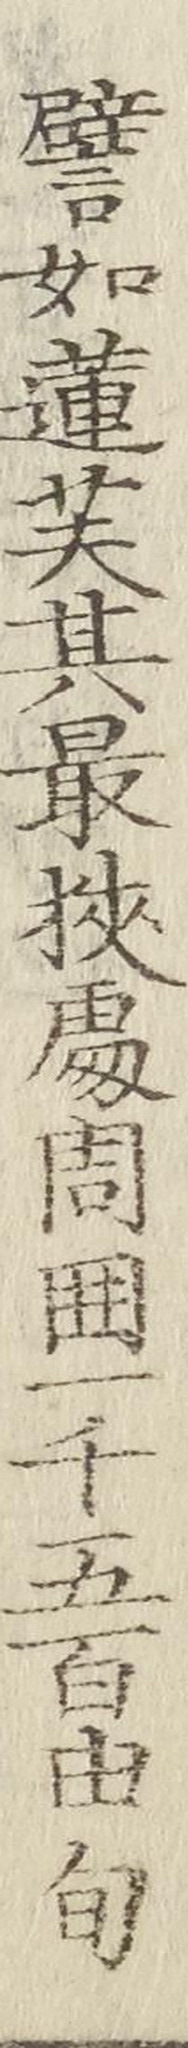譬如蓮芙其最狭処周囲一千五百由旬
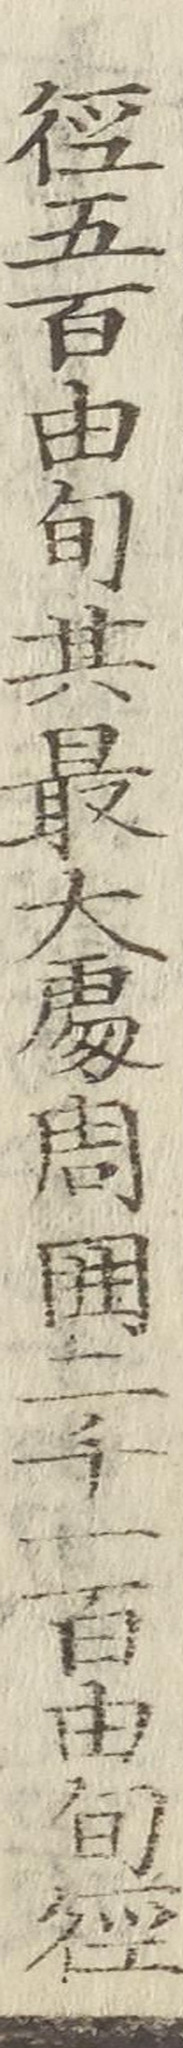径五百由旬其最大処周囲二千一百由旬径

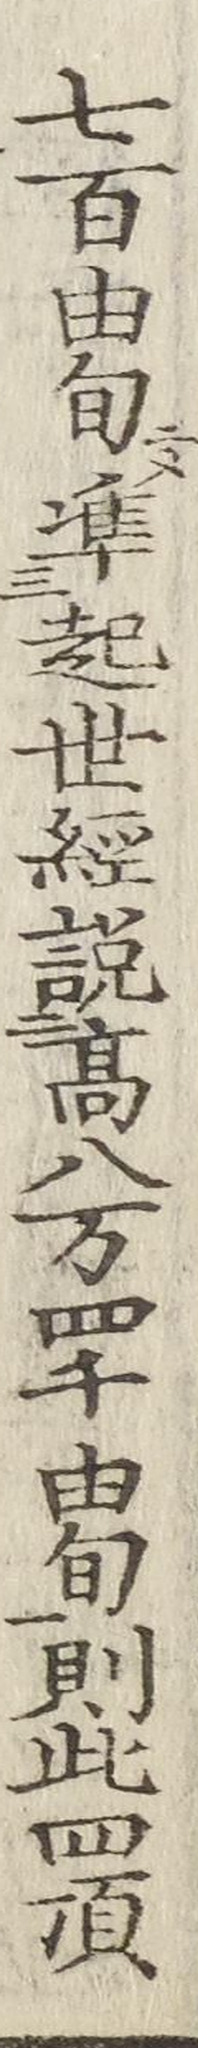日輪七百由旬準起世経説ニ高八万四千由旬則此四頂
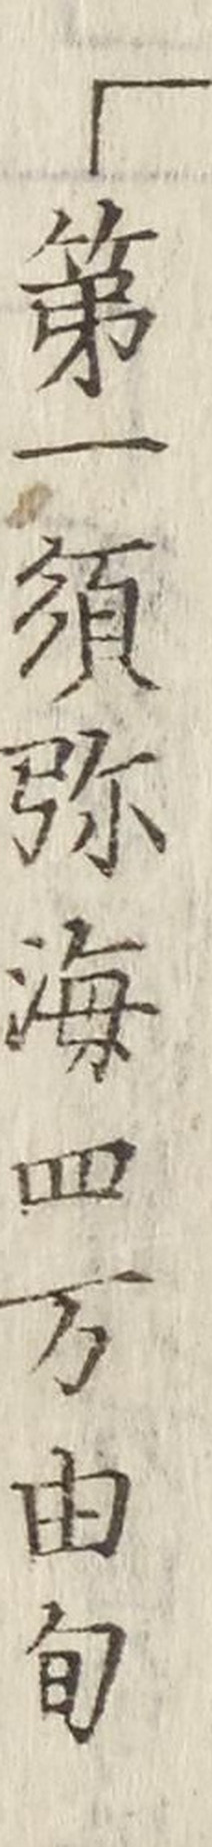第一須弥海四万由旬
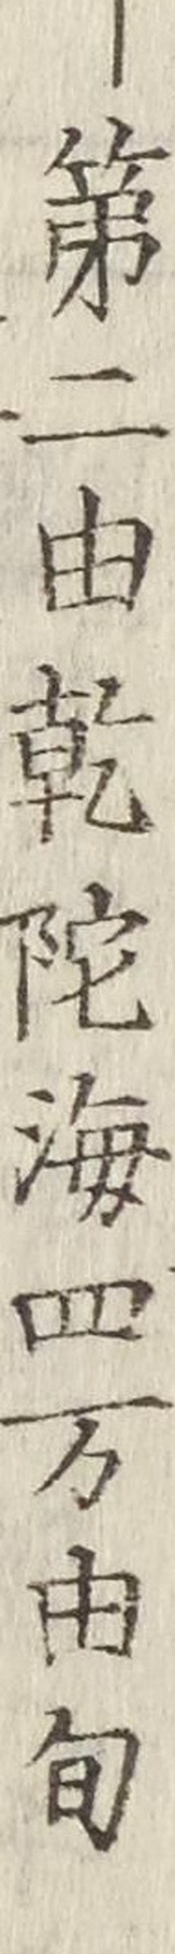第二由乾陀海四万由旬
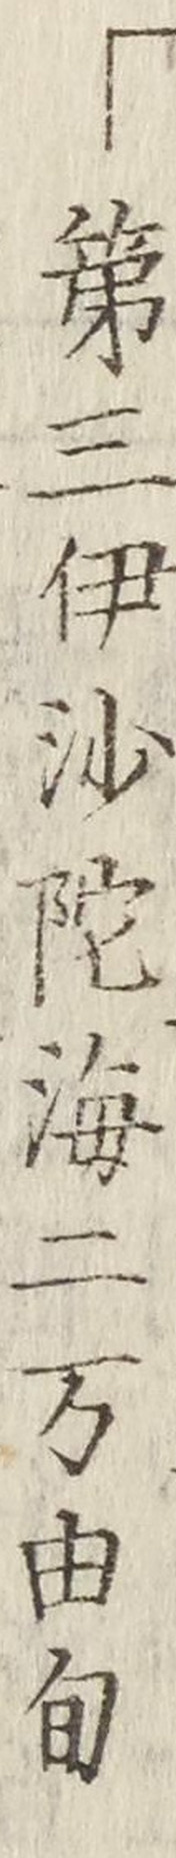第三伊沙陀海二万由旬
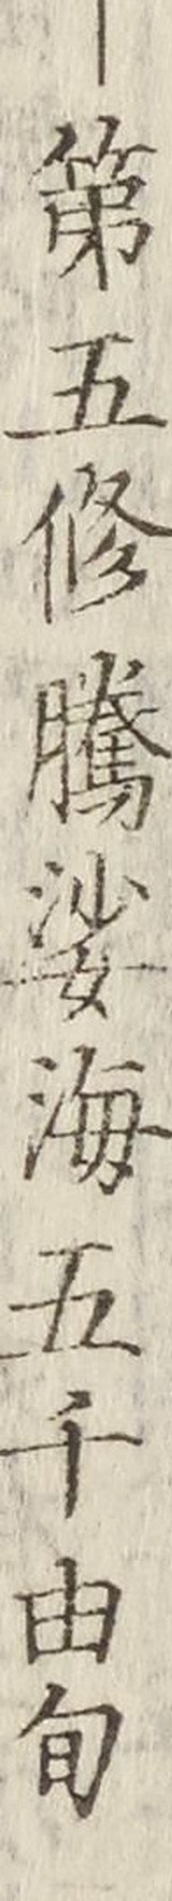第五修騰娑海五千由旬
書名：護法新論　二編　上
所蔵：東京大学地震研究所図書室 Earthquake Research Institute Library, The University of Tokyo, JAPAN
